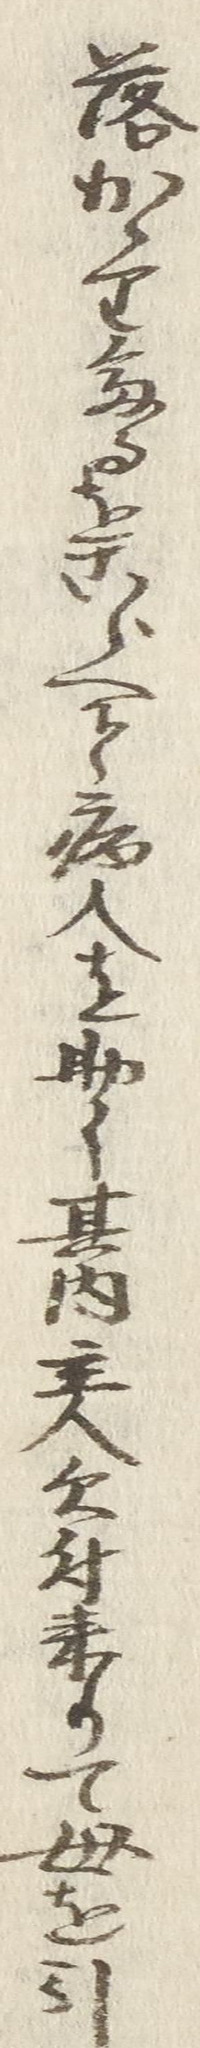落かゝりたるをこらへて病人を助く其内主人欠付来りて母を引
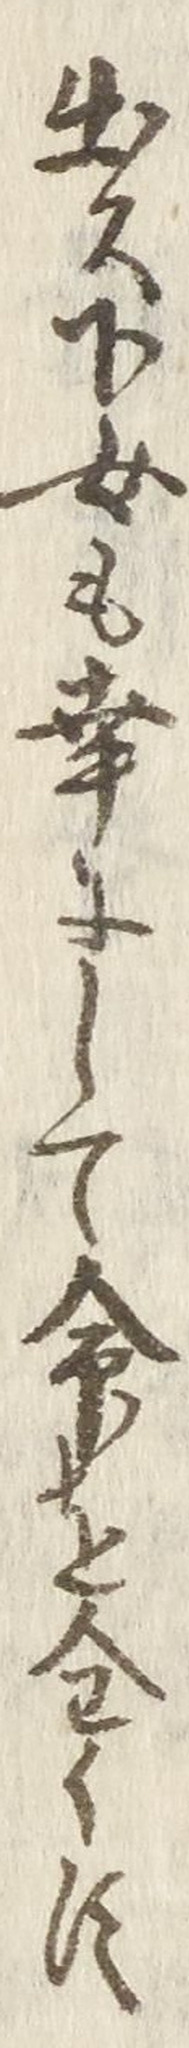出ス下女も幸にして命を全くす
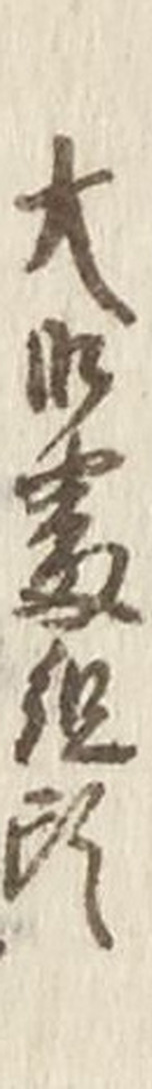大御番組頭
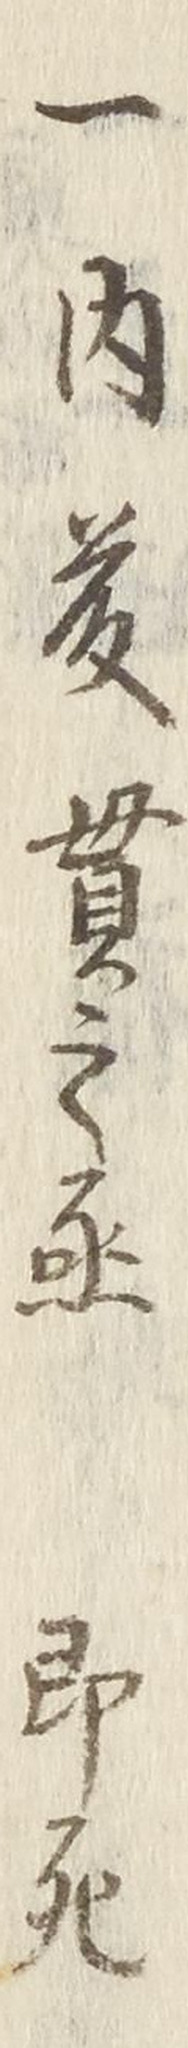一内藤貫之丞即死
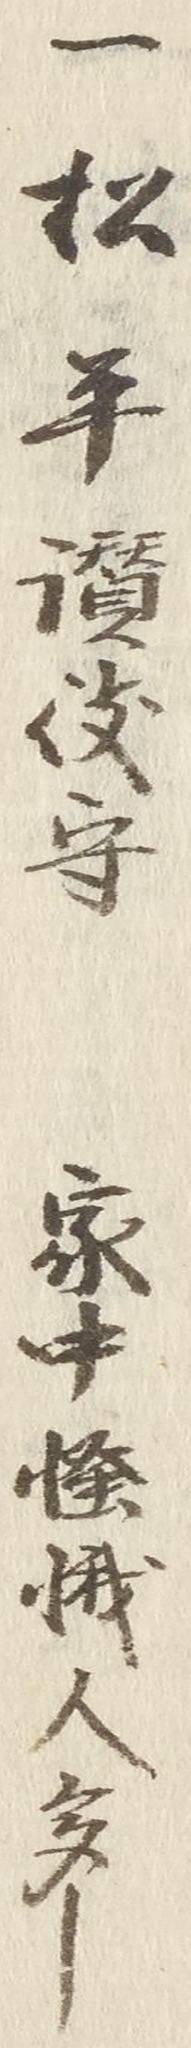一松平讃岐守家中怪我人多し
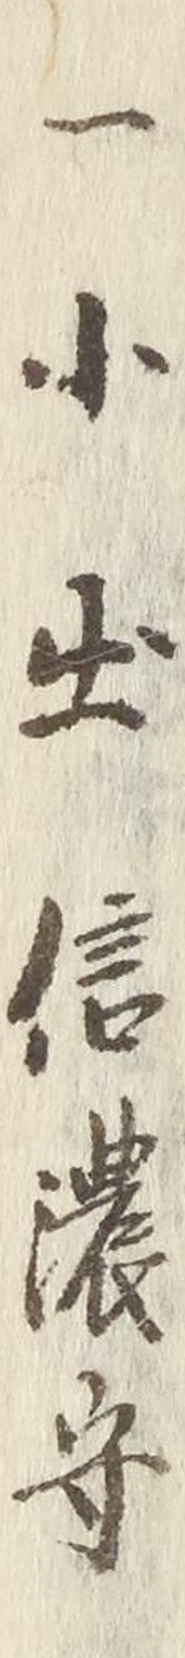一小出信濃守
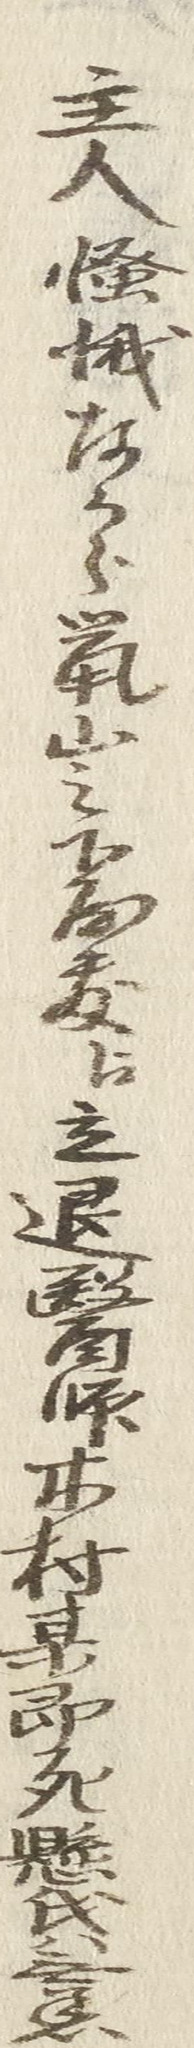主人怪我なから鼡山之下屋敷江立退医師木村某即死懸氏は無恙
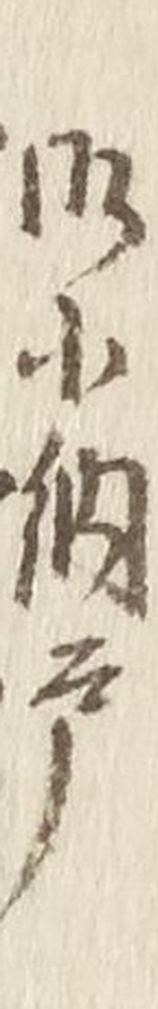御小納戸
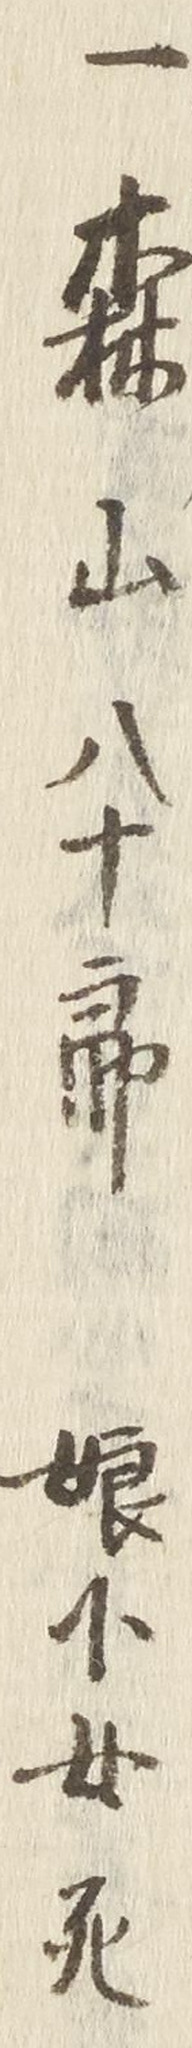一森山八十郎娘下女死
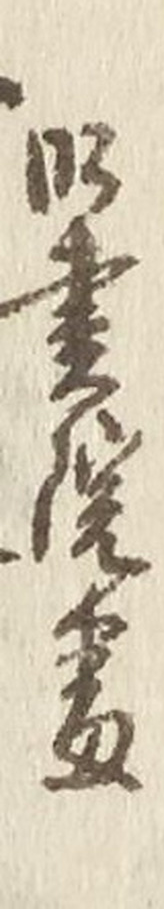御書院番
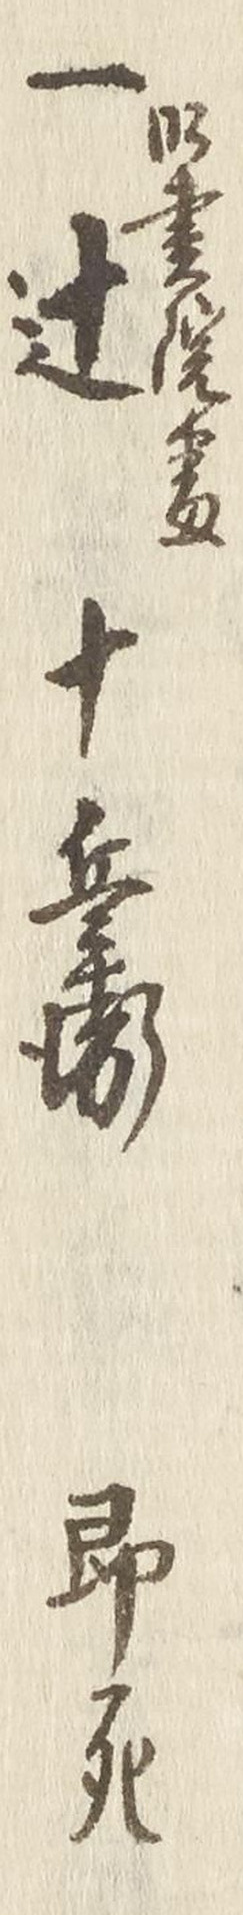一辻十兵衛即死
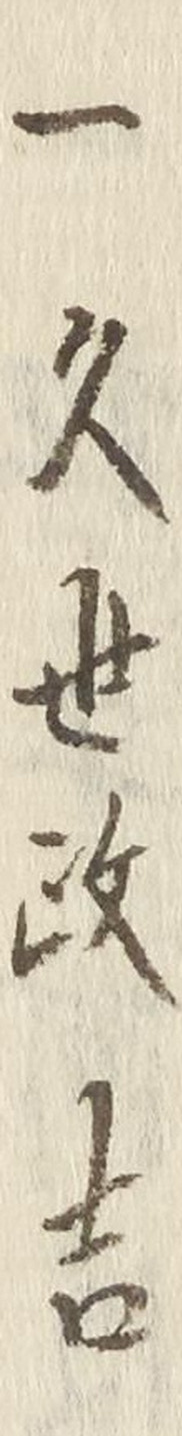一久世政吉
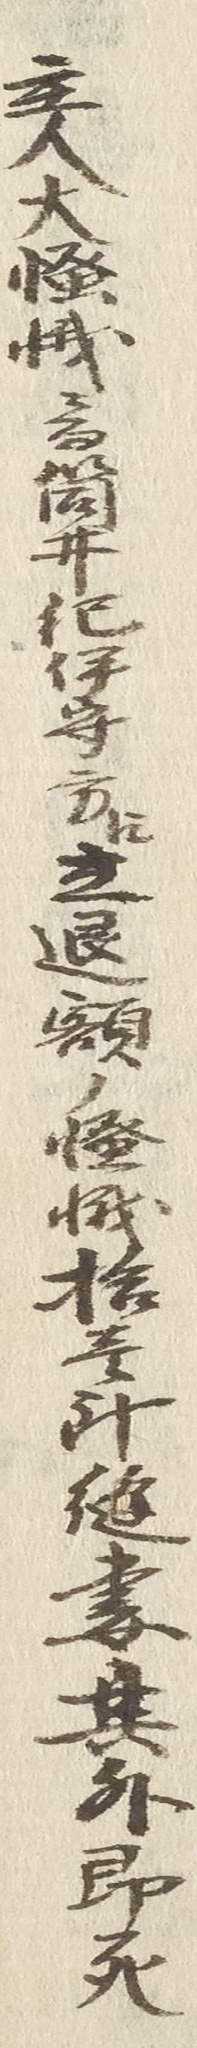主人大怪我ニ而筒井紀伊守方江立退額ノ怪我拾壱針縫妻其外即死
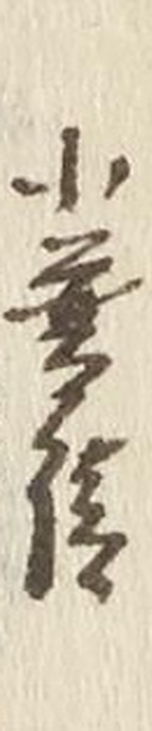小普請
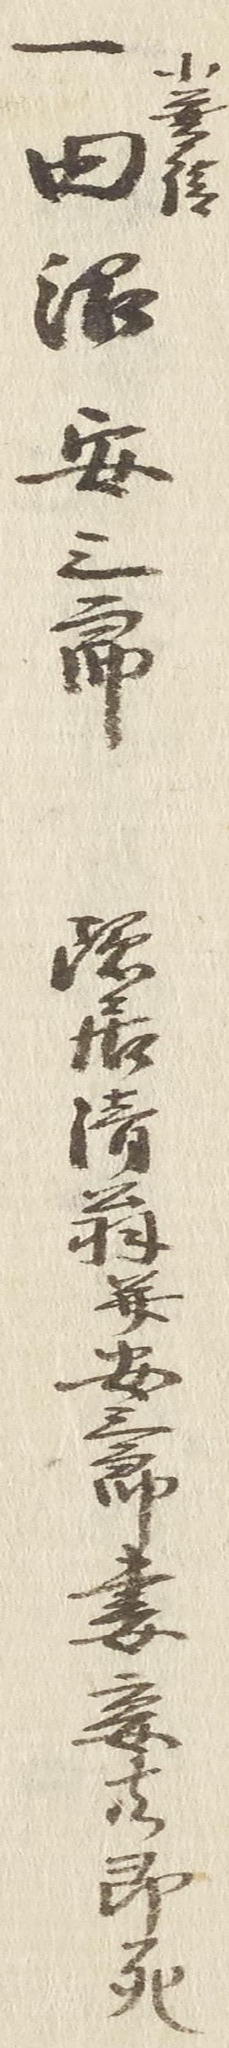一田沼安三郎隠居清翁并安三郎妻妾共即死
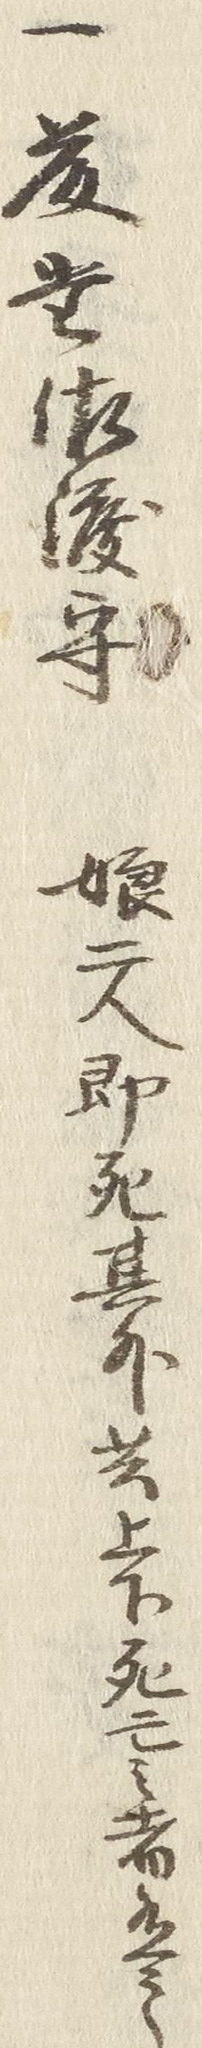一藤堂佐渡守娘二人即死其外共上下死亡之者有之
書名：従往古地震御届書記誌之一
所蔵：東京大学地震研究所図書室 Earthquake Research Institute Library, The University of Tokyo, JAPAN
